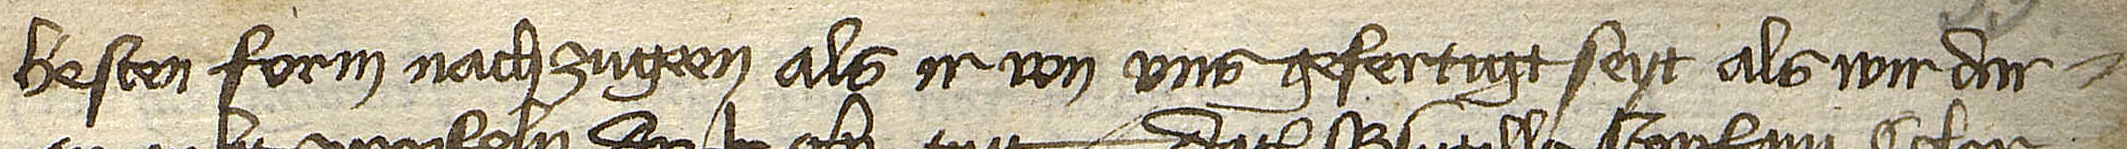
beſten form nachʒugeen als ir von vns gefertigt ſeyt als wir dar =
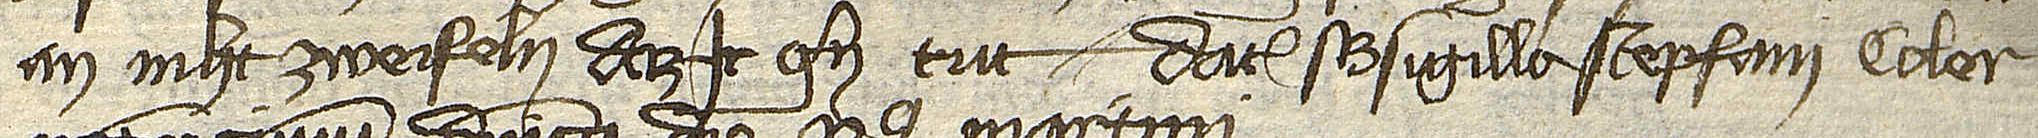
an niht ʒweifeln Daʒ Ir g*n tut / Dat* ſ* ſigillo ſtepfani Coler
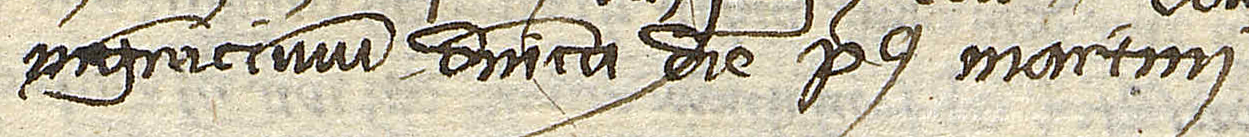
m*griciuiu* dnica* die p* martini
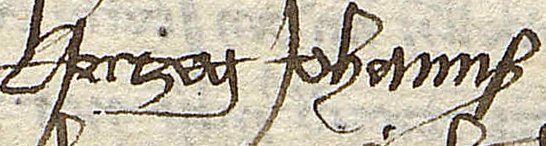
Hercʒog Iohannſ*
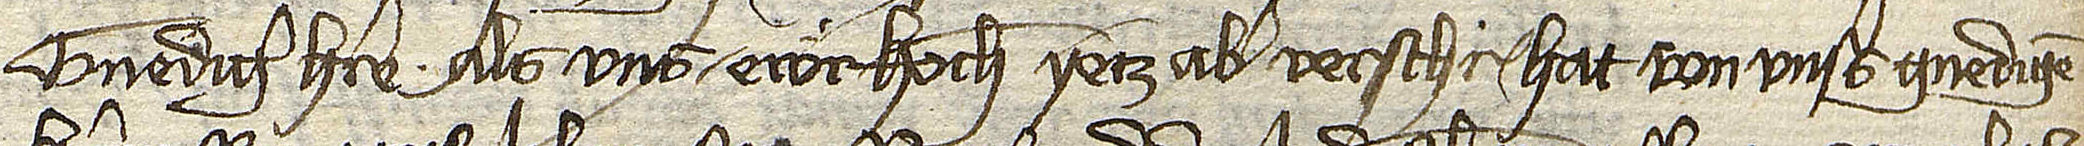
Gnedig* h*re . als vns / eẅr hoch* yecʒ* ab* verſchr* hat von vnſ*s gnedige*
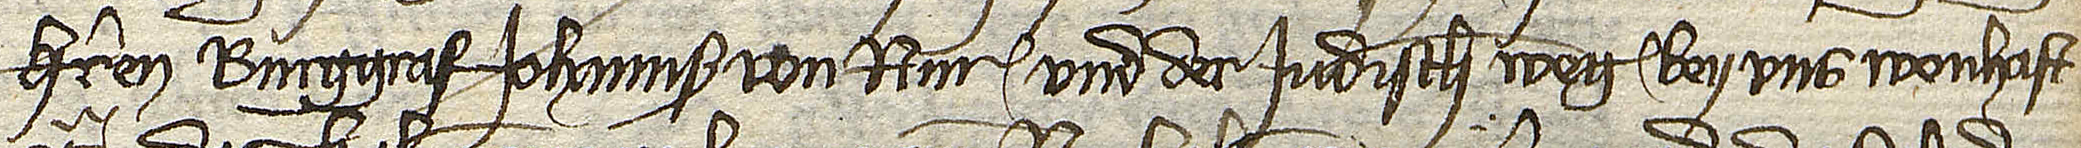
h*ren Burggraf Iohannſ* von Nur* vnd der Iudiſch* weg* bey vns wonhaft
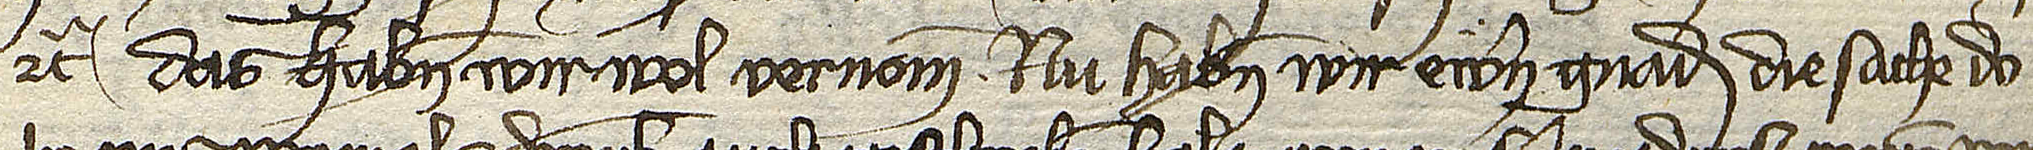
ec* Das habn* wir wol vernom* . Nu habn* wir eẅ*n gnad* die ſache do
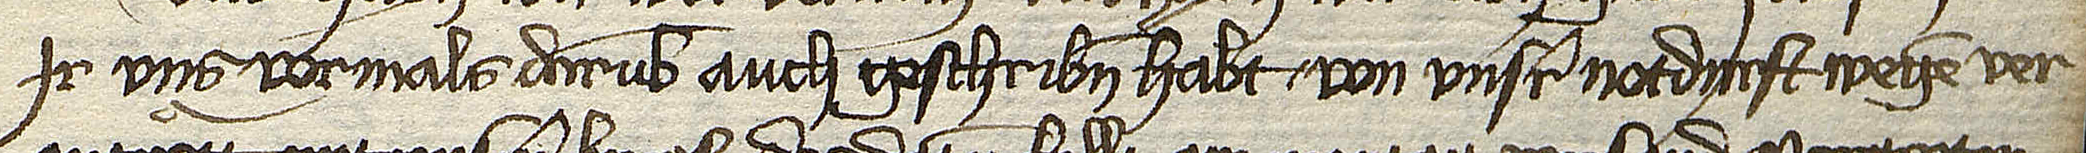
Ir vns vormals darub* auch geſchribn* habt / von vnſr* notdurft wege* ver
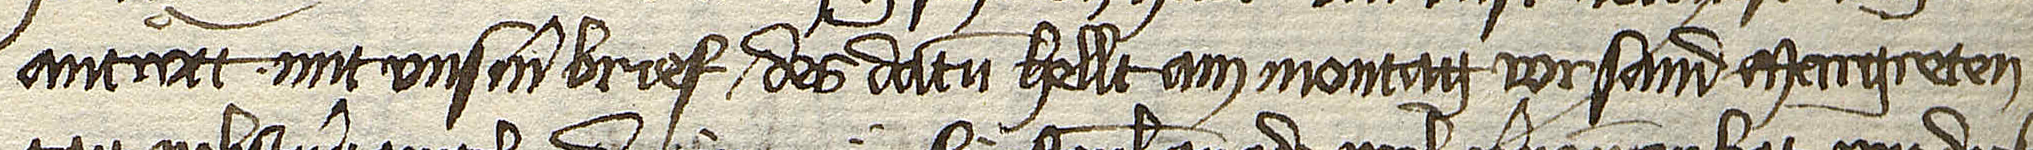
antw*tt . mit vnſm* brief / des datu* hellt am montag vor ſand Margreten
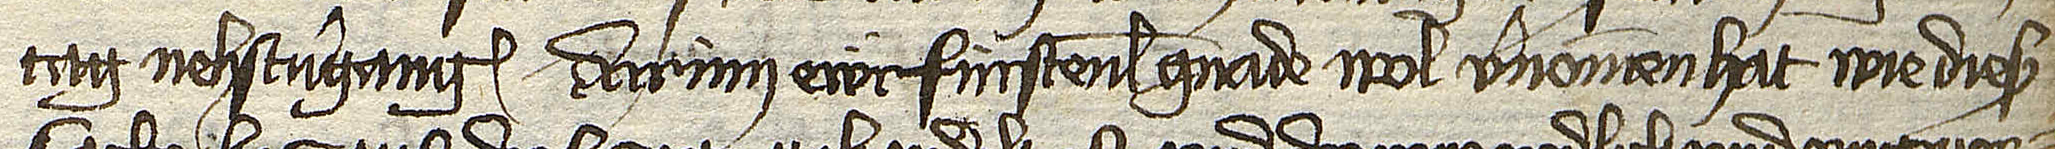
tag nehſtu*gang* / darinn eẅr fürſtenl* gnade wol v*nom*en hat wie dieſ*
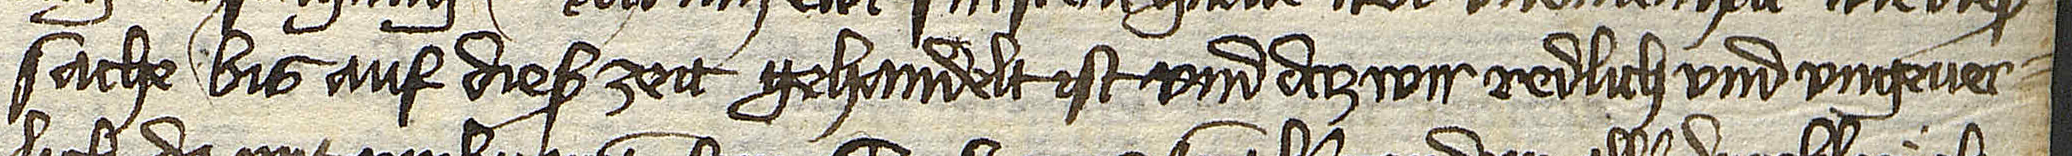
ſache bis auf dieſ* ʒeit gehandelt iſt vnd daʒ wir redlich vnd vngeuer =
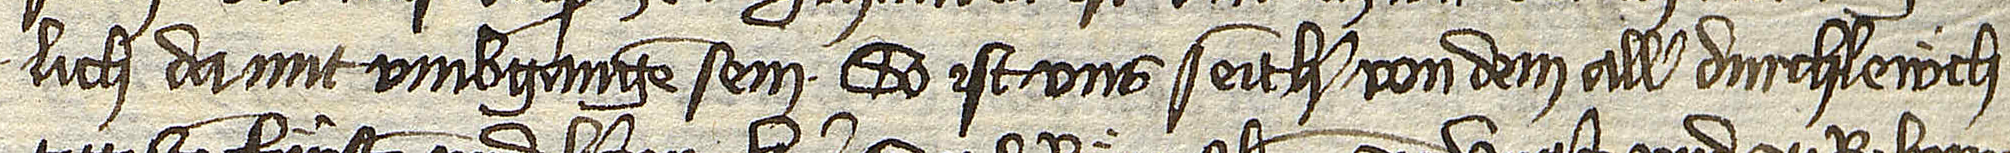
lich da mit vmbgange* ſein . So iſt vns ſeith* von dem all* durchleẅch
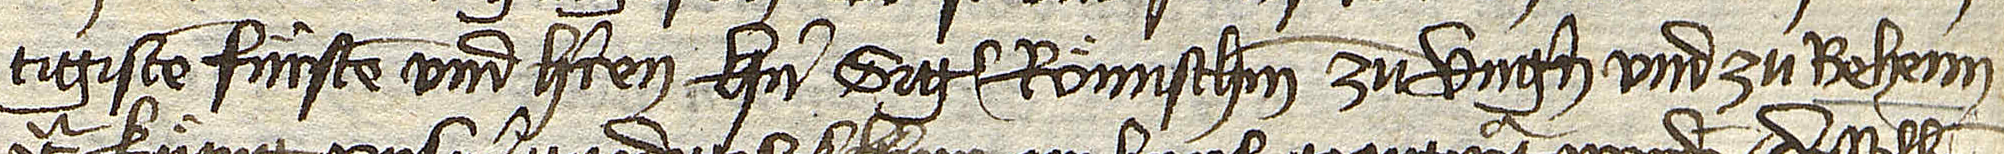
tigiſte* fürſte* vnd h*ren Hn* Sig* Römiſchm* ʒu Vng*n vnd ʒu Beheim
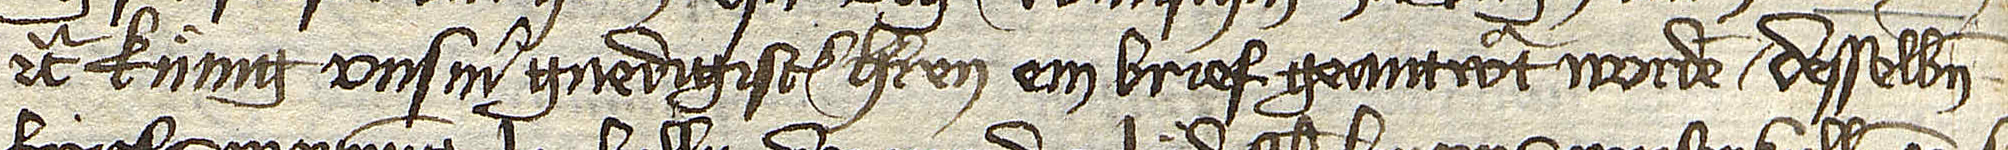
ec* künig vnſm* gnedigiſt* h*ren ein brief geantw*t worde* / Deſſelbn*
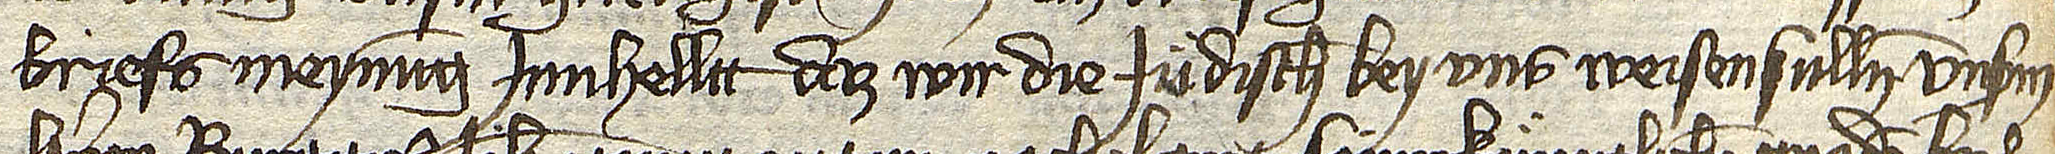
briefs meynu*g Innhelltt daʒ wir die Iüdiſch* bey vns weiſen ſulln* vnſ*m
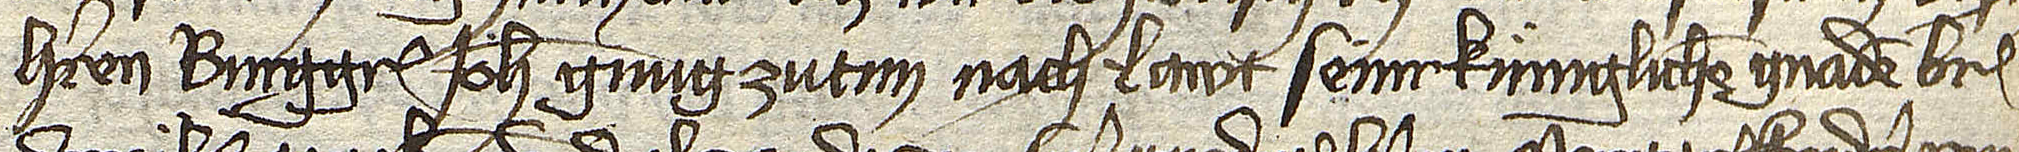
h*ren Burggr* Ioh* gnug ʒutun nach lawt ſeinr künigliche* gnade* br*
